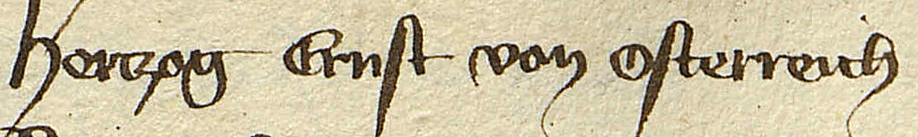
hercʒog Ernſt von Oſterreich
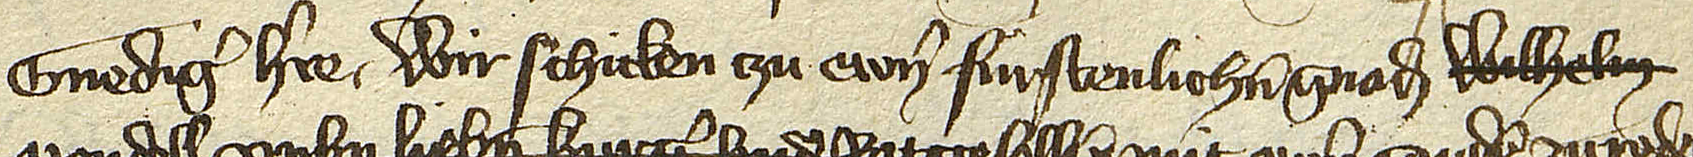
Gnedig* h*re / Wir ſchicken cʒu ewn* fürſtenlichn* gnad* Wilhelm
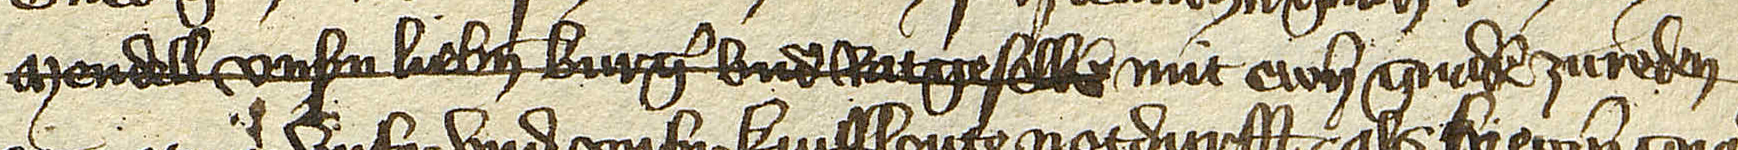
Mendell vnſ*n liebn* burg* vnd Ratgeſelle* mit ewn* gnade* cʒu reden
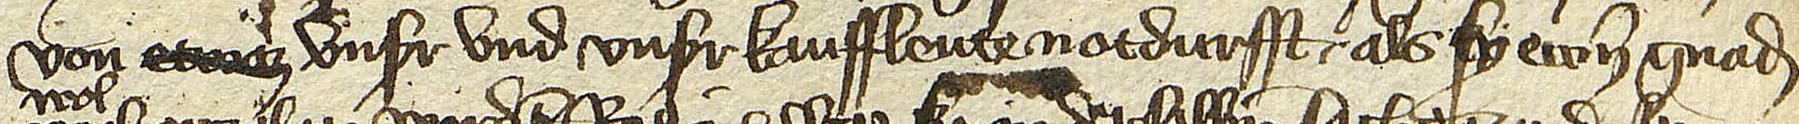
von etwaʒ vnſ*r vnd vnſ*r kauffleute notdurfft / als ſy ewn* gnad*
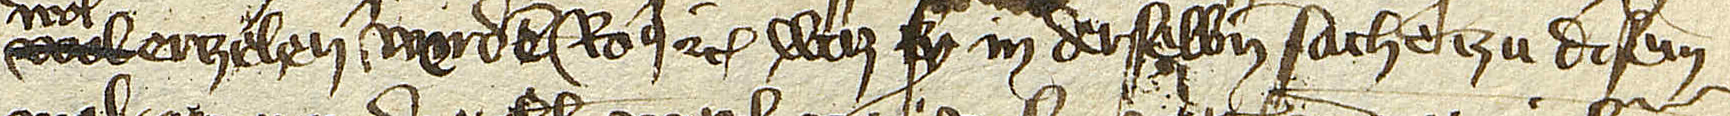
wol ercʒelen werde* Ro* ec* waʒ ſy in derſelbn* ſache cʒu diſem
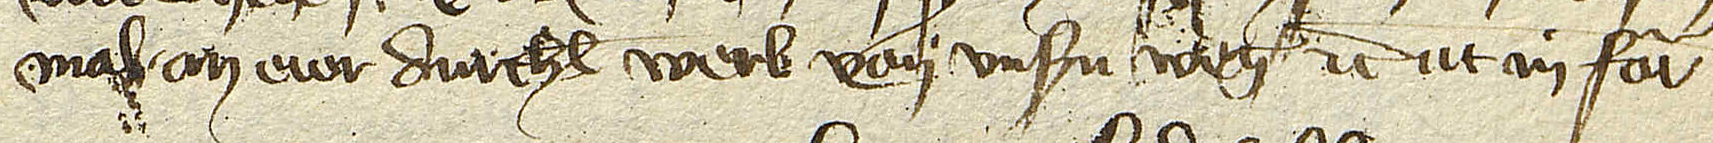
mal / an ewr durchl* werb von vnſ*n weg* ec* ut in for*
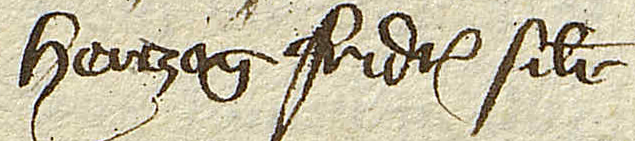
hercʒog Fridr* ſilr*
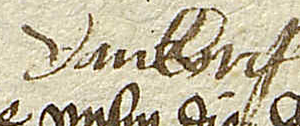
Dankbrif
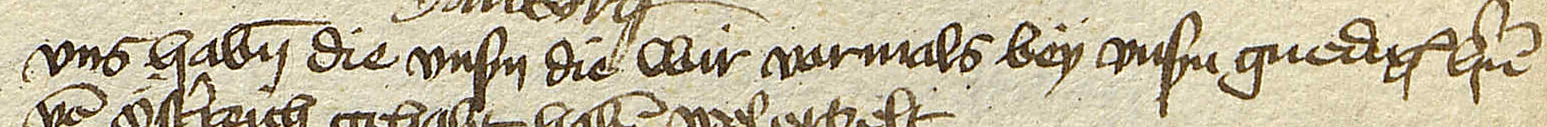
vns habn* die vnſ*n die wir vormals bey vnſ*n gnedig* h*re*
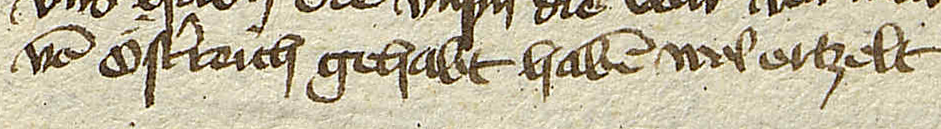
vo* Öſt*reich gehabt habe* wol ercʒelt
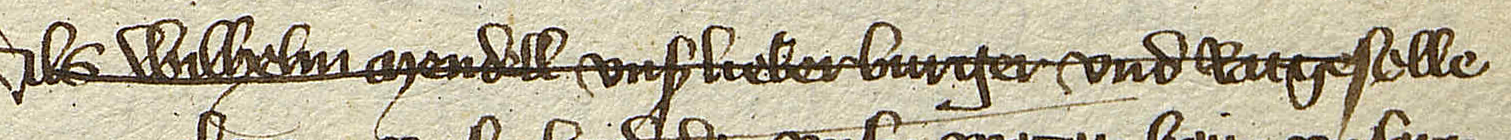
Als Wilhelm Mendell vnſ* lieber burger vnd Ratgeſelle
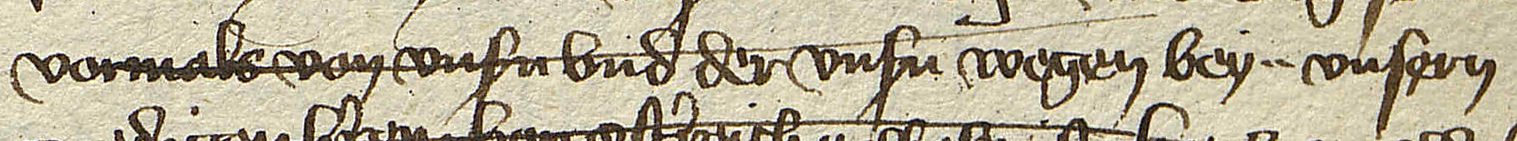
vormals von vnſ*n vnd der vnſ*n wegen bey ~ vnſern
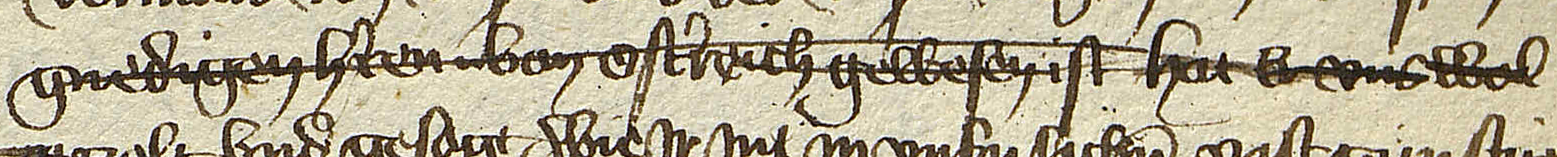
gnedigen h*ren ~ von Oſt*reich geweſen iſt hat er vns wol
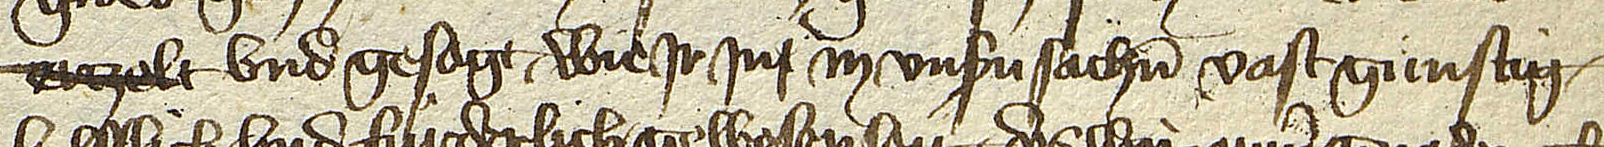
ercʒelt vnd geſagt / wie Ir Im in vnſ*n ſachn* vaſt gunſtig /
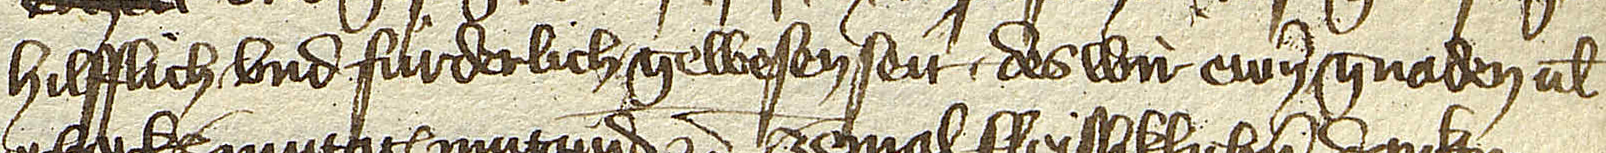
hilfflich vnd fürderlich geweſen ſeit / des wir ewn* gnaden %%*
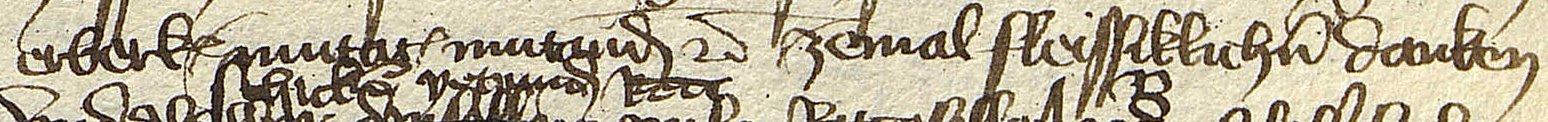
erberk* mutat* mutand* ec* / cʒemal fleiſſiklichn* danken
